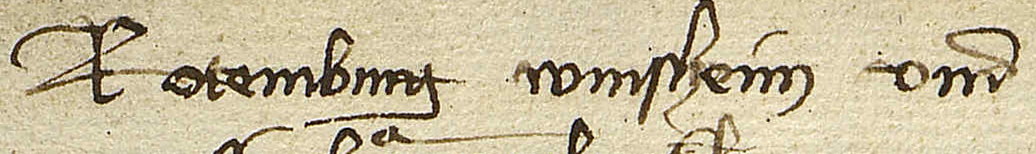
Rotemburg winſheim vnd
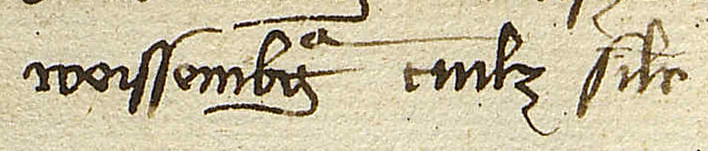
weiſſemb*g cuil* ſilr*
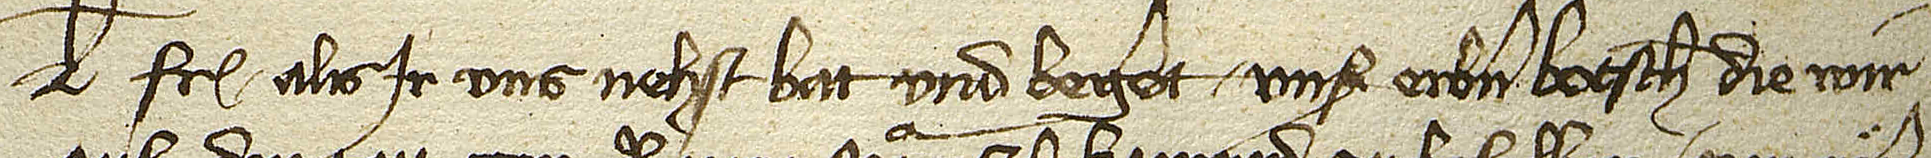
L* fr* als Ir vns nehſt bat vnd beget* / vnſ* erb*n botſch* die wir
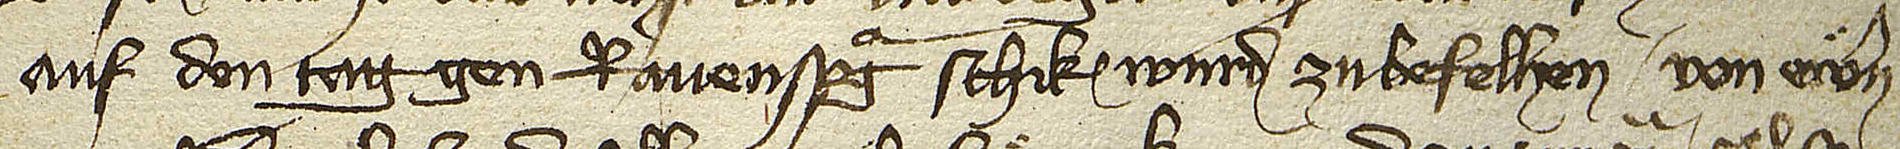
auf den tag gen Rauenſp*g ſchik* wurd* ʒu befelhen / von eẅ*n
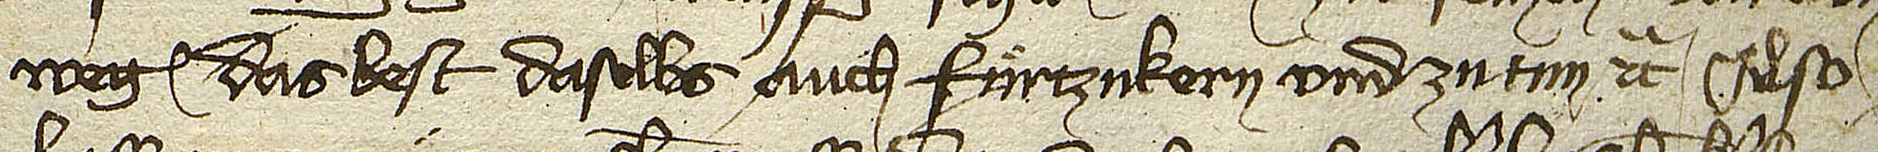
weg* das beſt daſelbs auch fürcʒukern vnd ʒu tun ec* Alſo
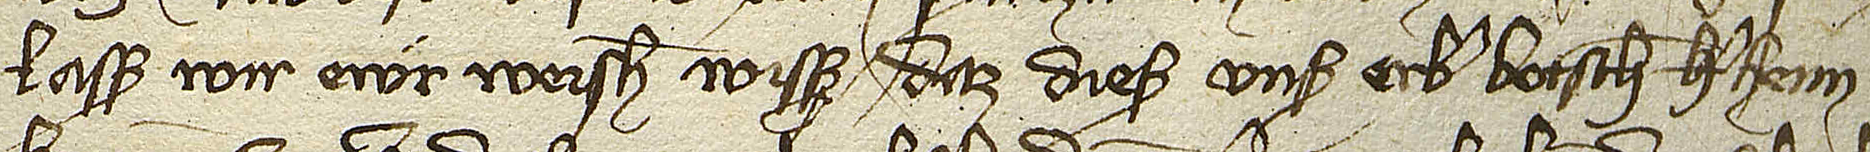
laſſ* wir eẅr weiſh* wiſſ* / daʒ dieſ* vnſ* erb* botſch* h* heim
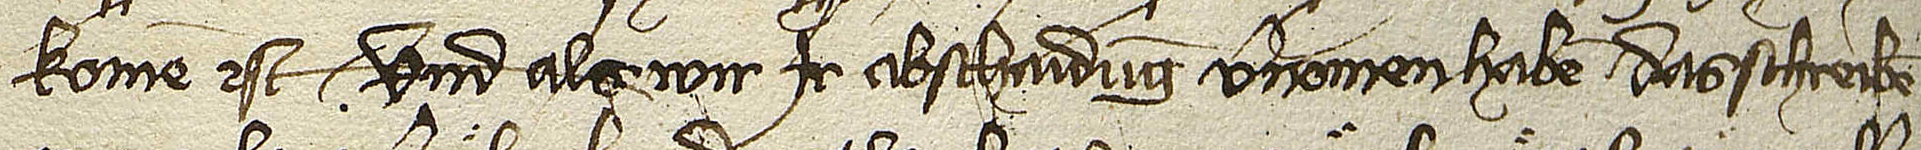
kome* iſt / Vnd aber wir Ir abſchaidu*g v*nomen habe / Das ſchreibe*
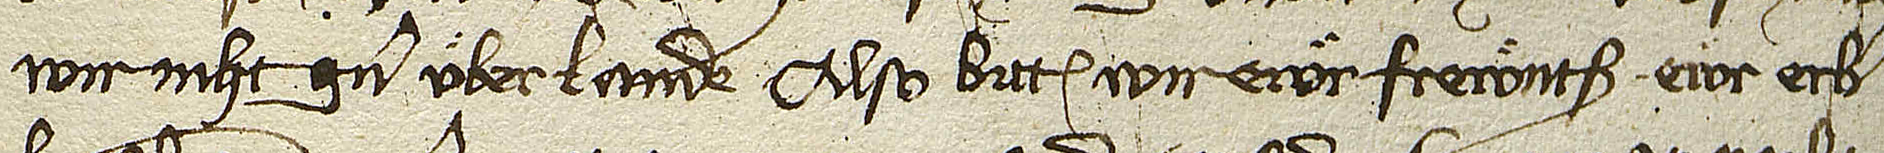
wir niht g*n v̈ber lande / Alſo bitt* wir eẅr freẅntſ* . eẅr erb*
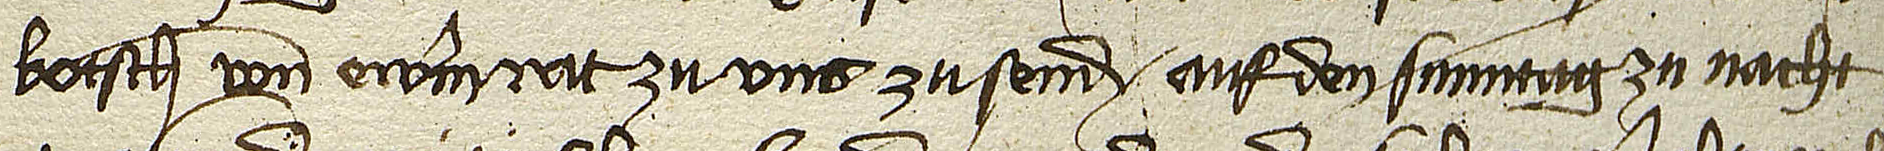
botſch* von ew*m rat ʒu vns ʒu ſend* auf den ſunntag ʒu nacht
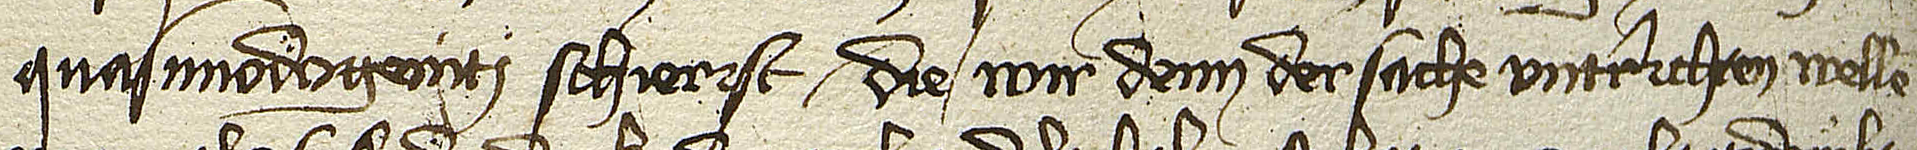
quaſimodogeniti ſchieriſt / Die wir denn der ſache vnt*richten welle*
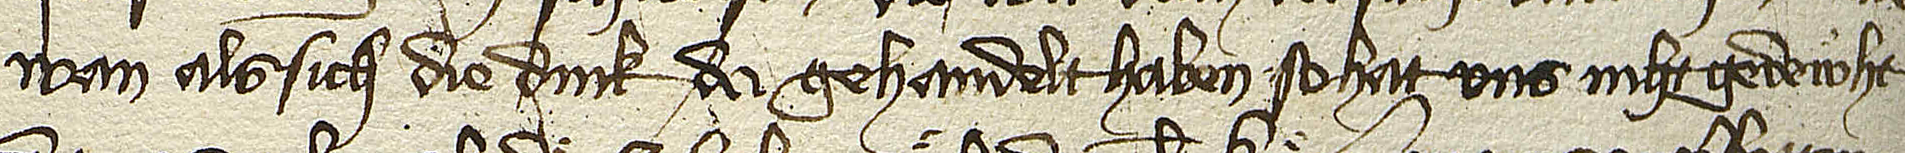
wan als ſich die dink do gehandelt haben . ſo hat vns niht gedeẅht
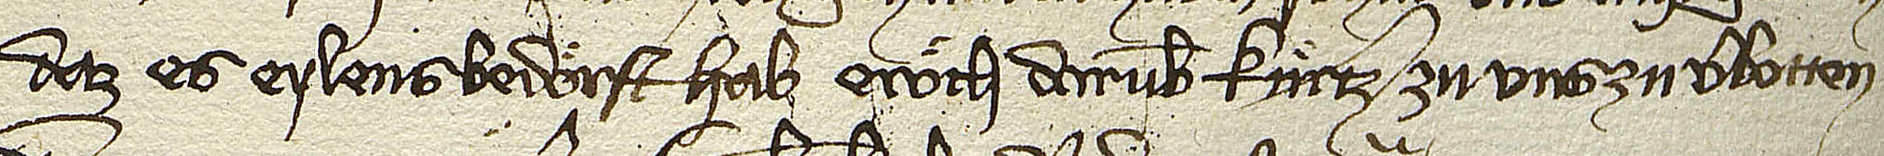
daʒ es eylens bedörft hab eẅch darub* kürcʒ* ʒu vns ʒu v*botten
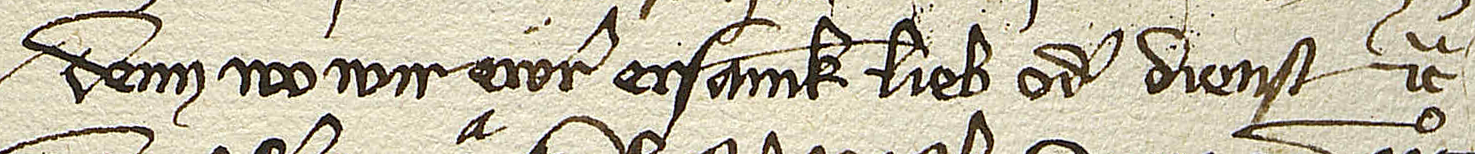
Denn wo wir eẅr* erſamk* lieb od* dienſt ec*
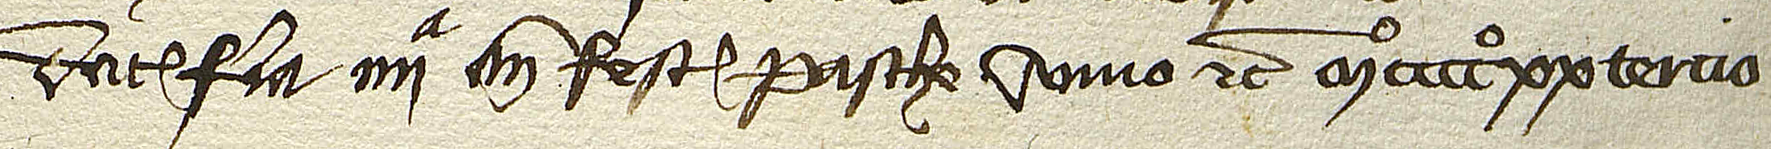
Dat* f*ia iiii* an* feſt* Paſche Anno ec* M*cccc* xx tercio
